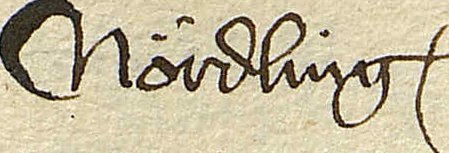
Nördling*
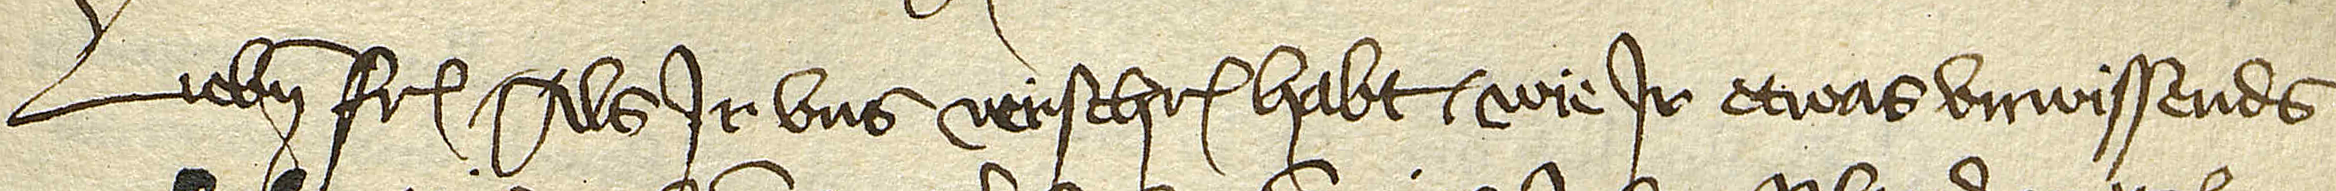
Liebn* fr* / Als Ir vns verſchr* habt / wie Ir etwas vnwiſſends
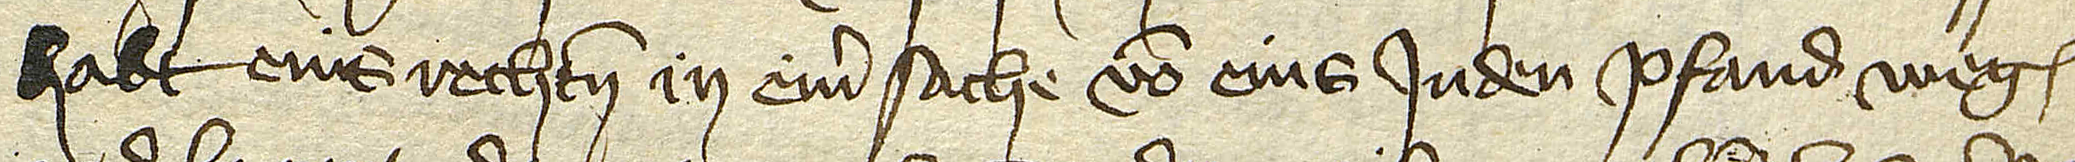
habt eins rechtn* in ein* ſache vo* eins Iuden pfand weg*
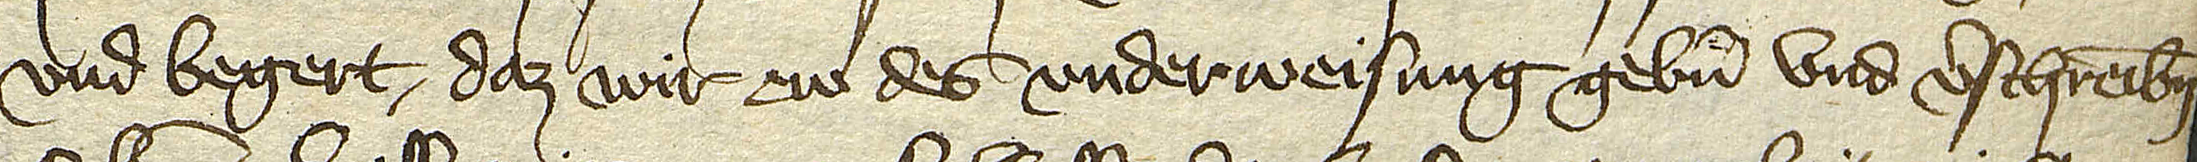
vnd begert / daʒ wir ew des vnderweiſung gebn* vnd v*ſchreibn*
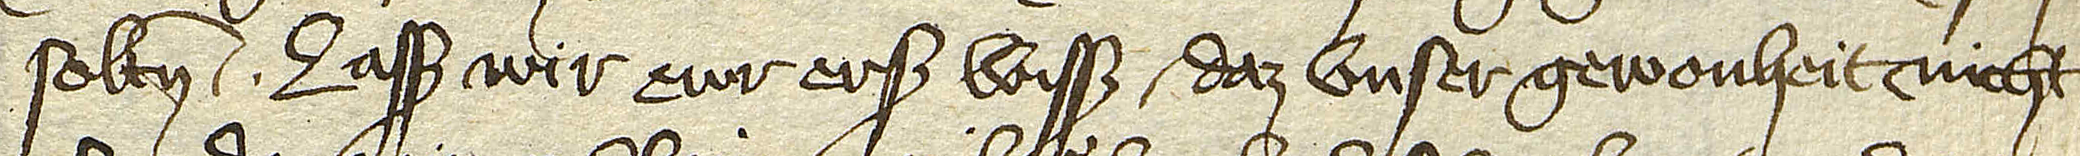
ſoltn* / . Laſſ* wir ewr erſ* wiſſ* / daʒ vnſer gewonheit nicht
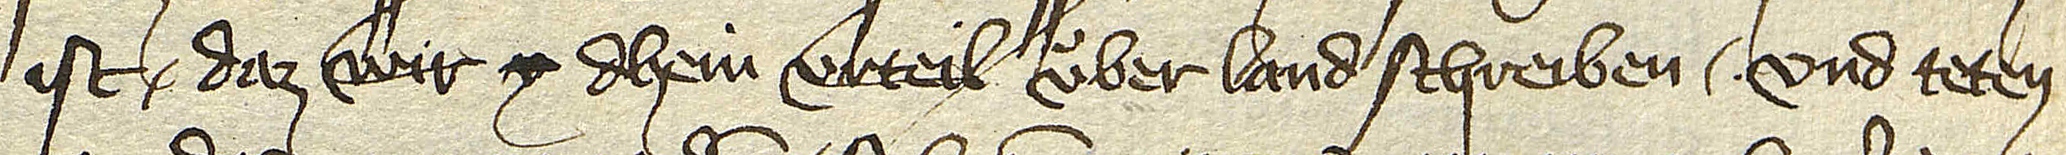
iſt / daʒ wir y dhein vrteil v̈ber land ſchreiben / . vnd teten
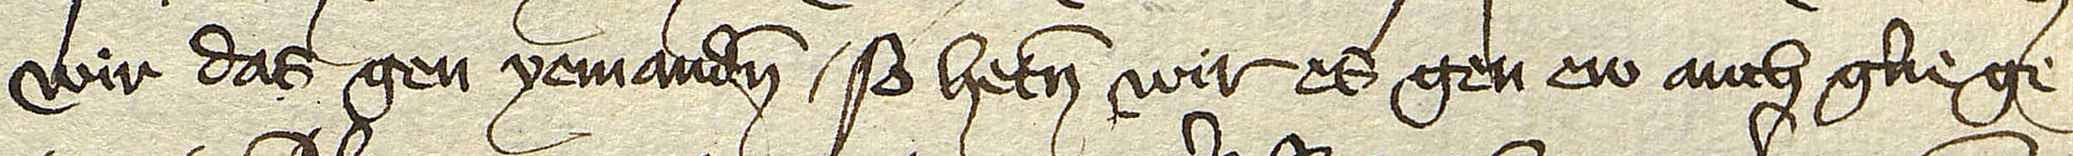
wir das gen yemandn* / ſo hetn* wir es gen ew auch g*ne ge
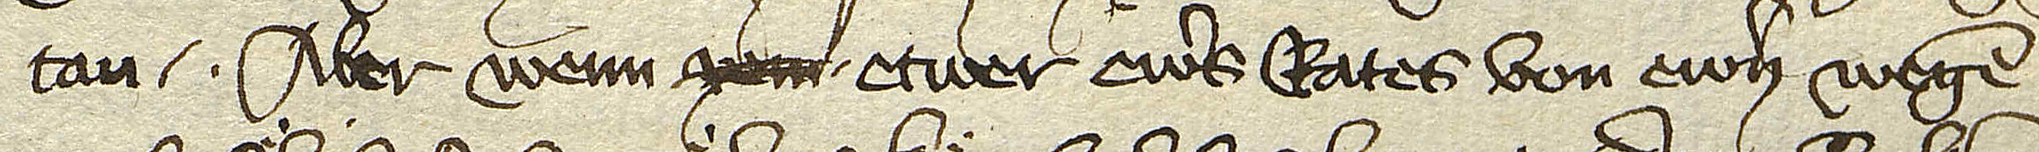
tan / . Aber wenn yem etwer ew*s Rates von ewn* wege*
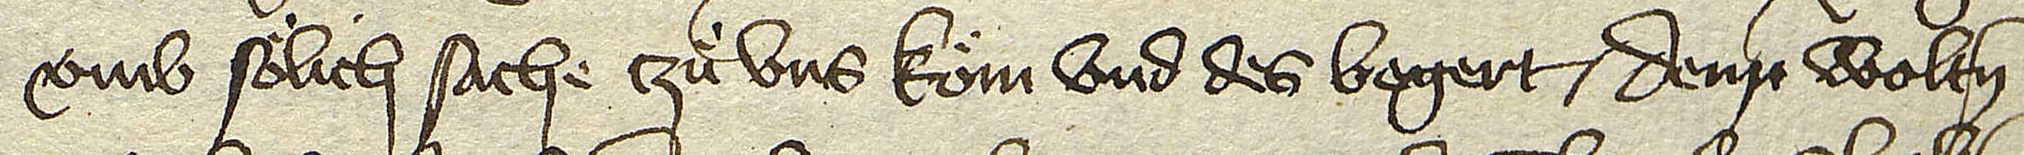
vmb ſölich ſache cʒü vns köm vnd des begert / dem woltn*
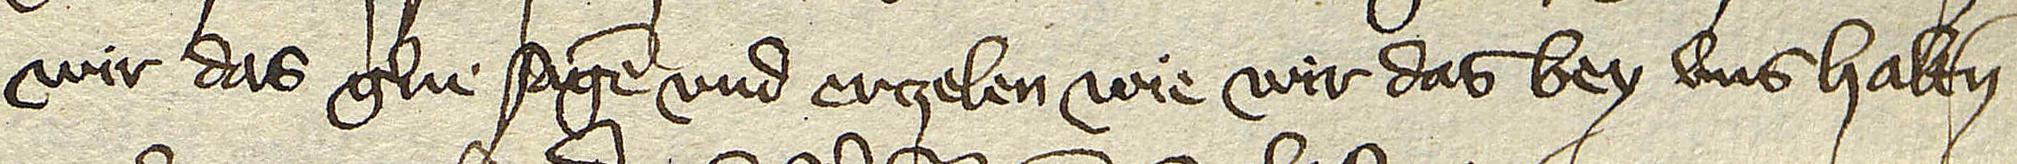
wir das g*ne ſage* vnd ercʒelen wie wir das bey vns haltn*
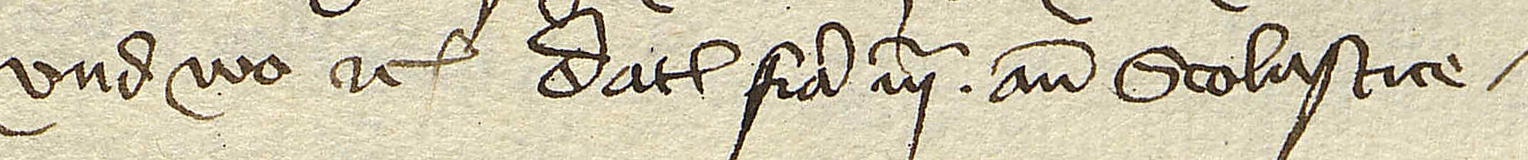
vnd wo ec* Dat* fia* iii* . an* Scolaſtice /
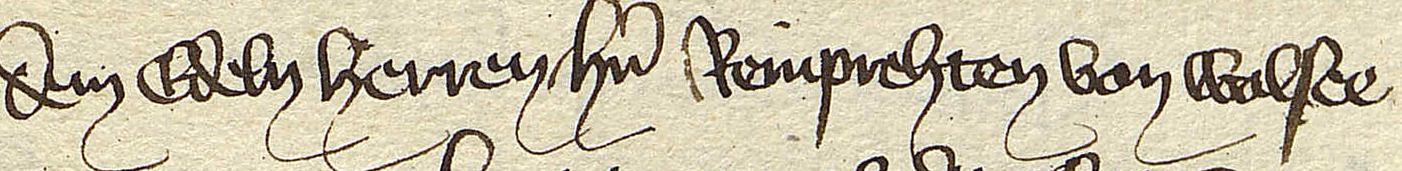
dem Edeln herren / hn* Reinprehten von walſee
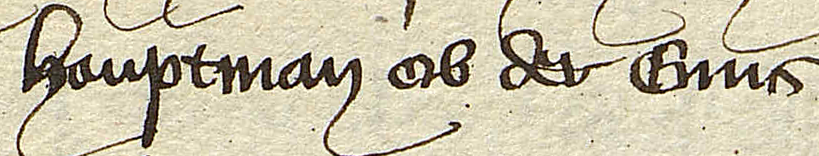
Hauptman Ob der Enns
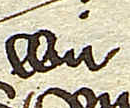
wir
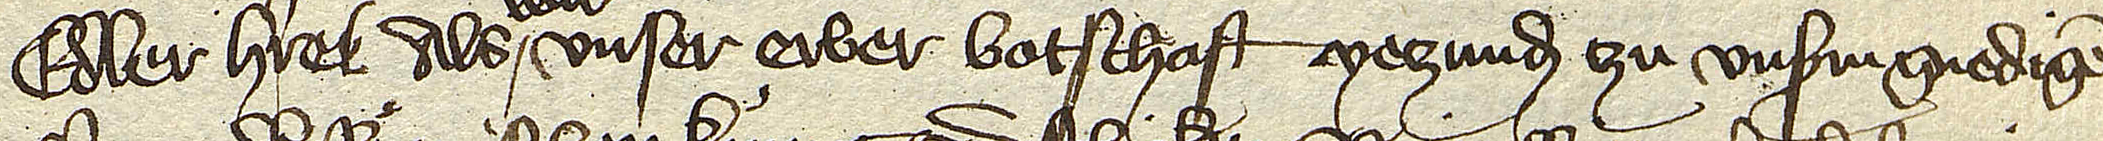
Edler h*re / Als vnſer erber botſchaft yecʒund* cʒu vnſ*m gnedige*
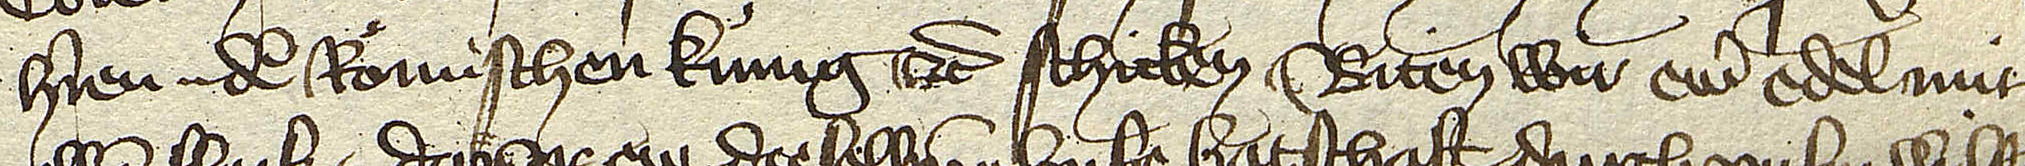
h*ren ~ de* Römiſchen künig ec* ſchicken / Biten wir ew* edel mit
